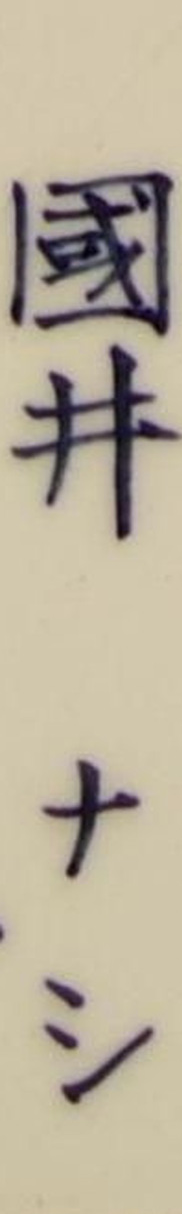國井ナシ
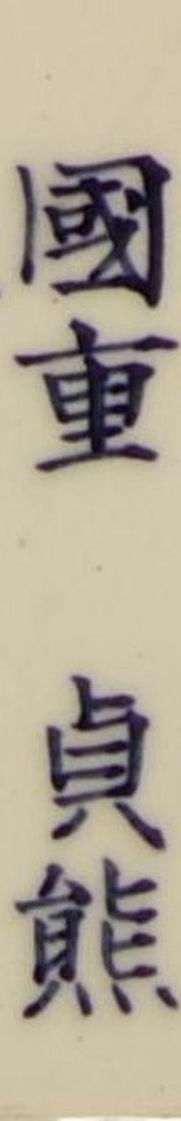国重貞熊
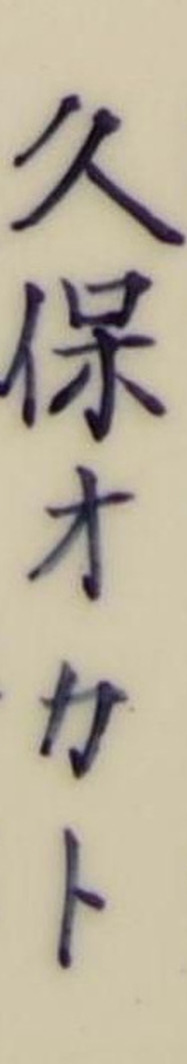久保オカト
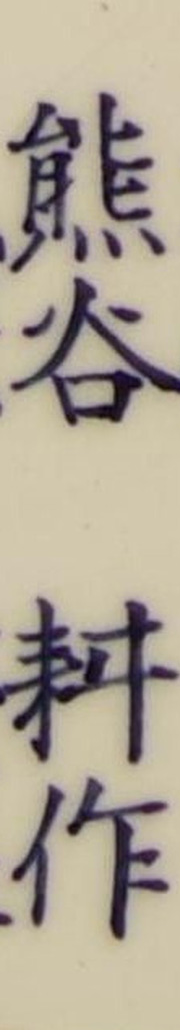熊谷耕作
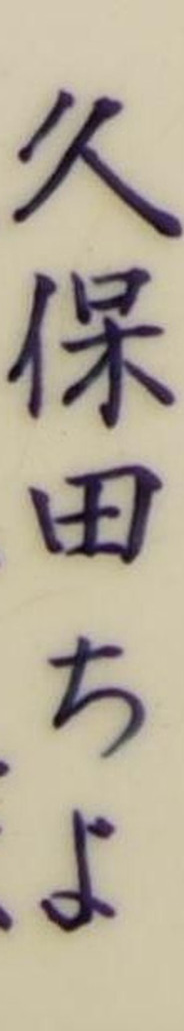久保田ちよ
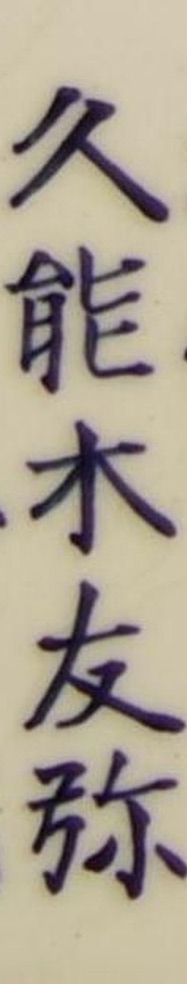久能木友弥
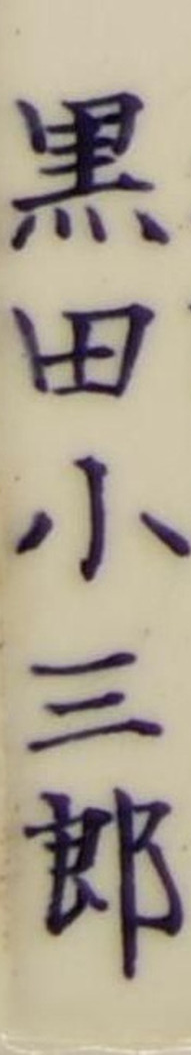黒田小三郎

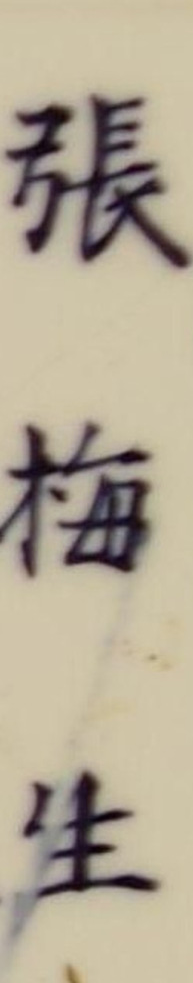張梅生
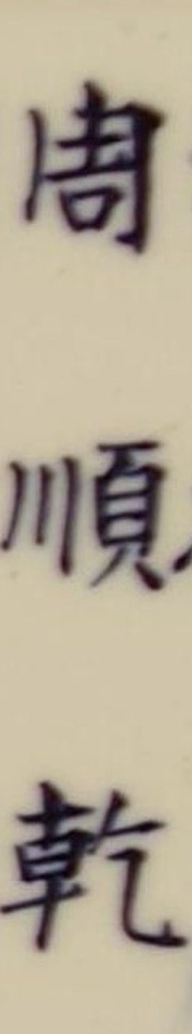周順乾
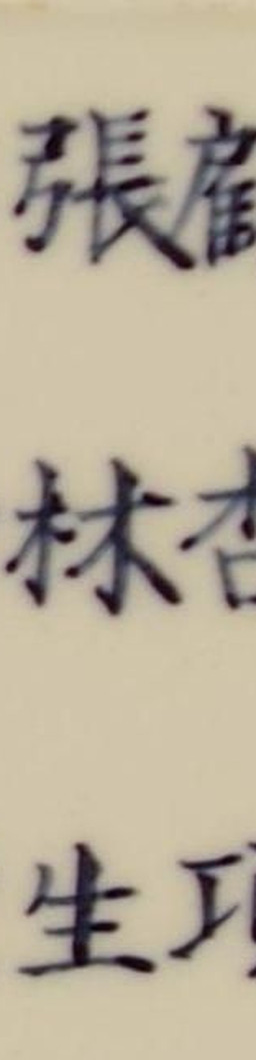張林生
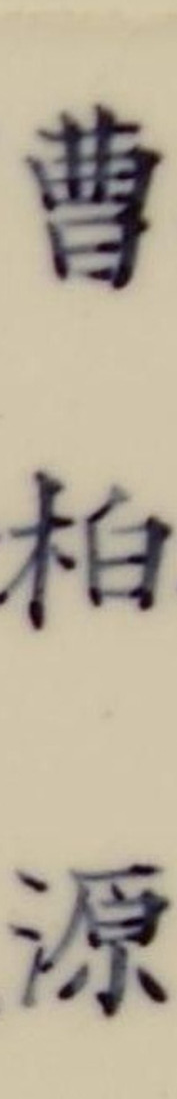曹柏源
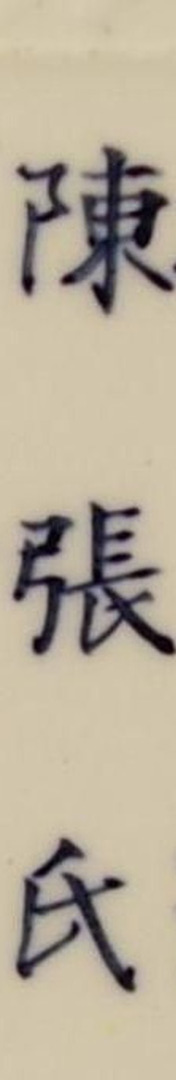陳張氏
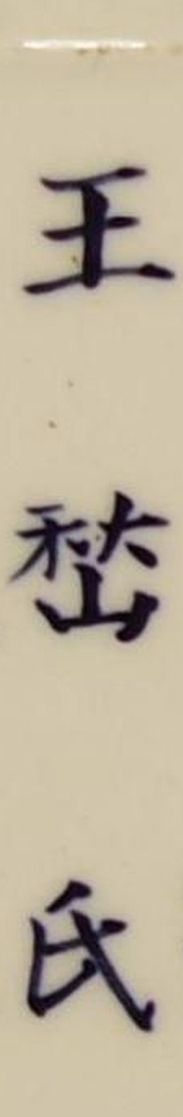王嵆氏
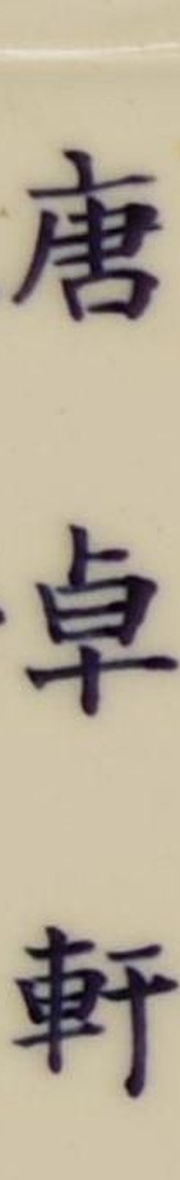唐卓軒
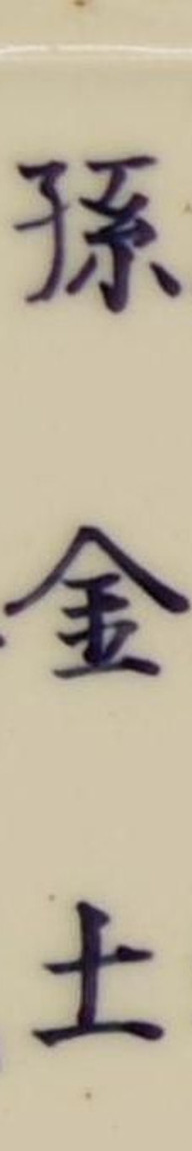孫金土

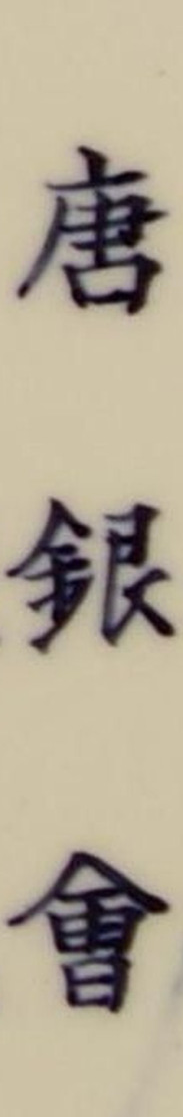唐銀會
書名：E~L
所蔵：高野山金剛峯寺
